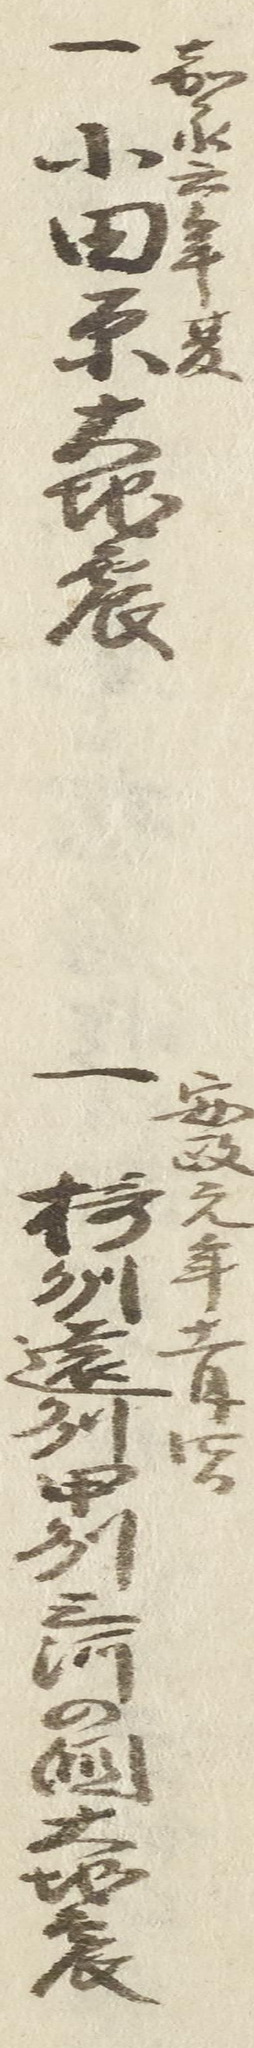一小田原大地震一摂洲遠州甲州三河の国大地震
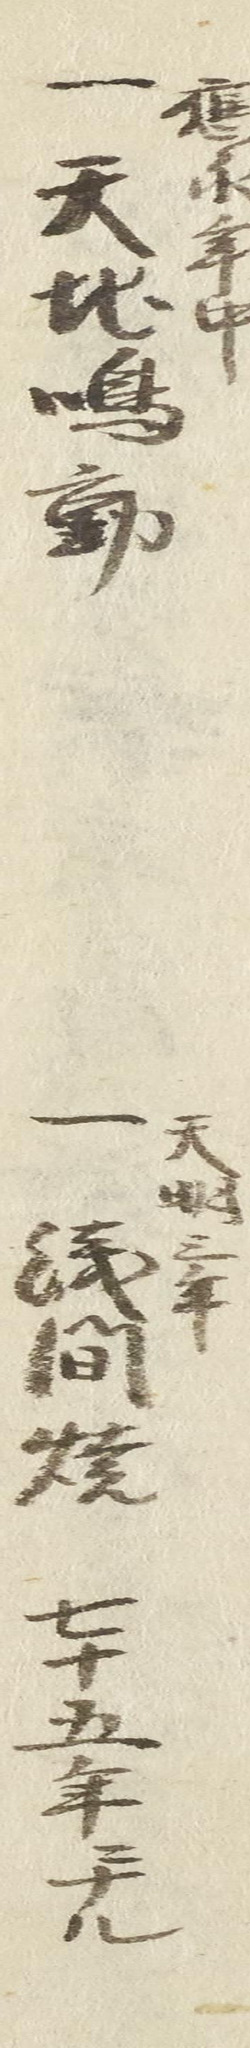一天地鳴動一浅間焼七十五年二ナル
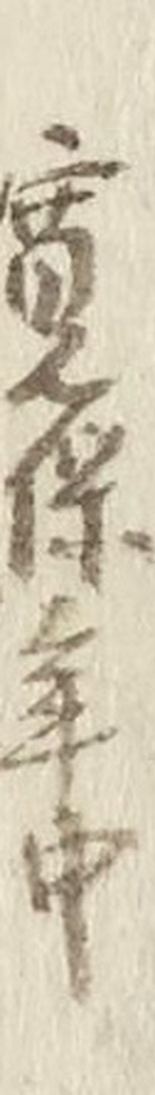寛保年中
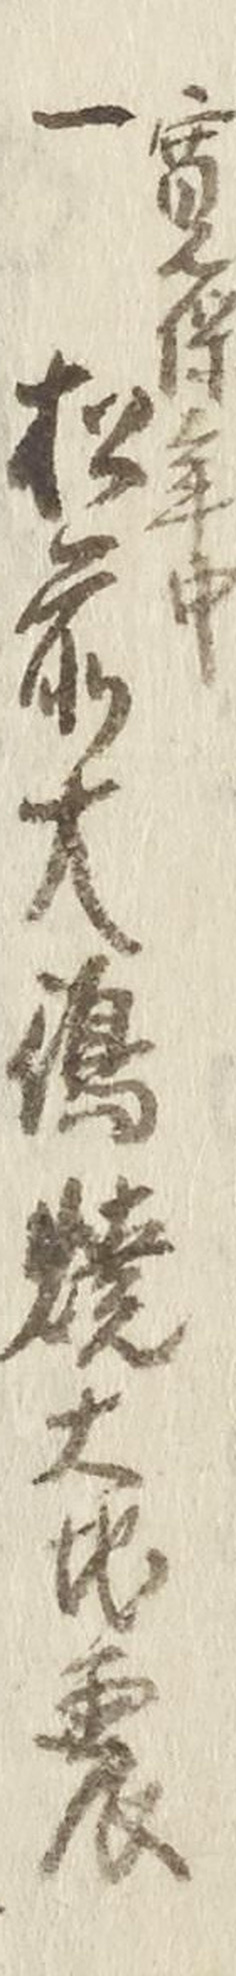一松前大嶋焼大地震
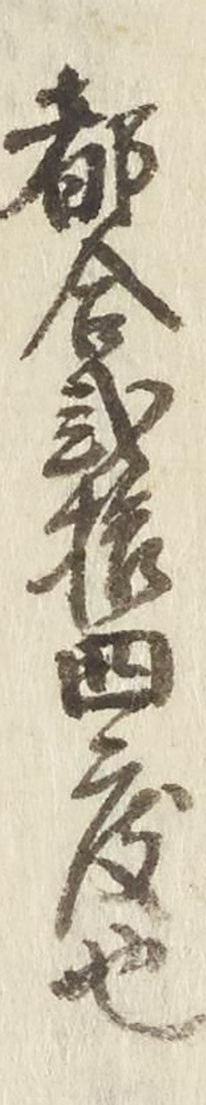都合弐拾四度也
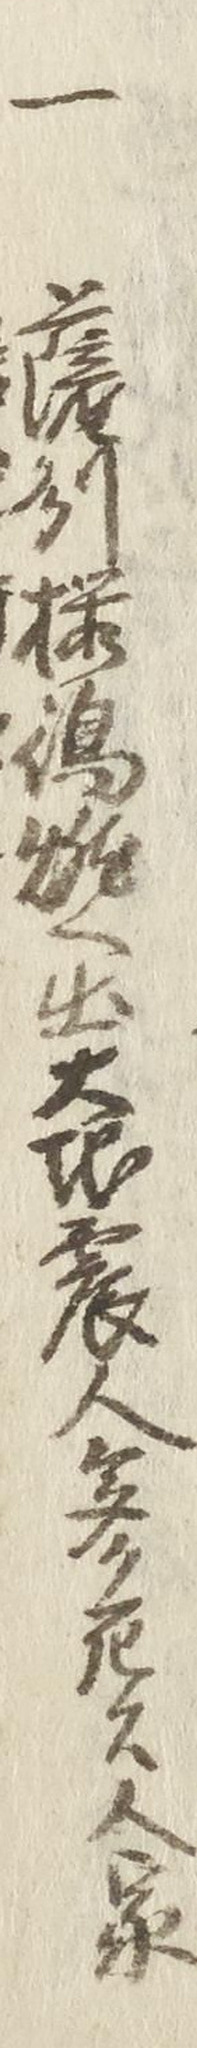一薩洲桜嶋焼大地震人多ㇰ死ス人家
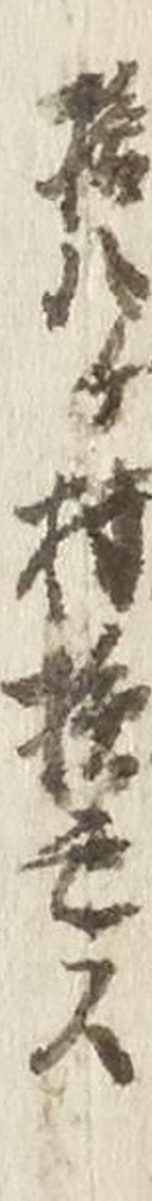拾八ヶ村損亡ス

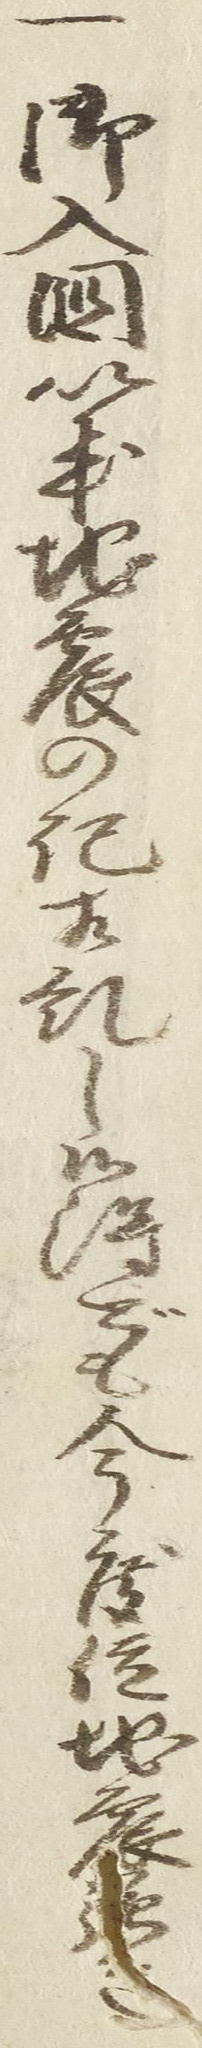一御入国以来地震の記相糺し候得ども今度位地震強き
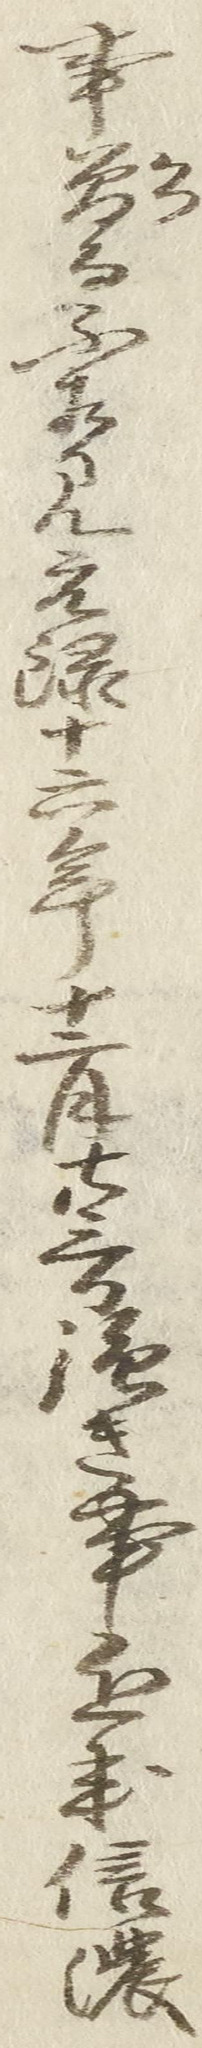事曾而不相見元禄十六年十二月廿三日強き事近来信濃
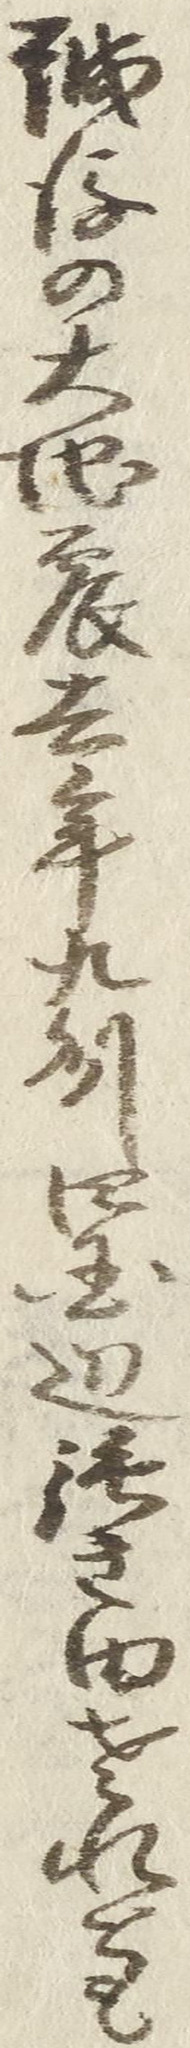越後の大地震去年九州四国辺強き由けれども
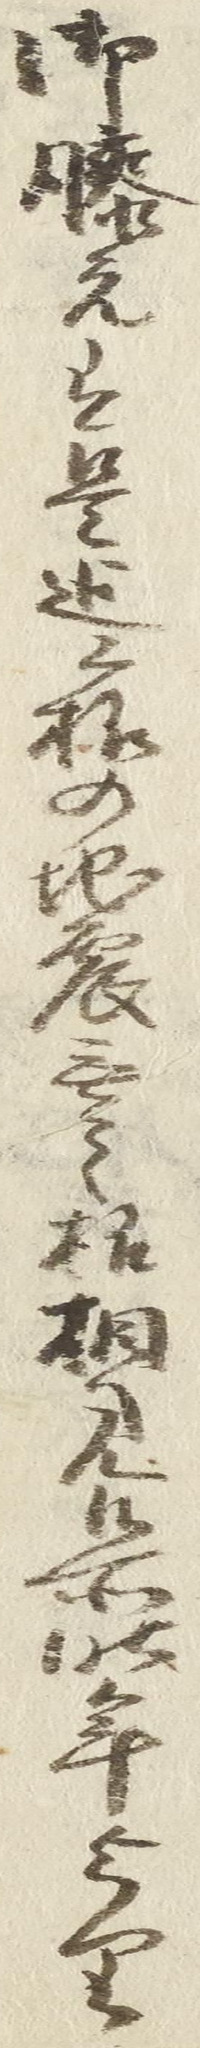御膝元は是迄ヶ様の地震無之様相見侯所昨年より
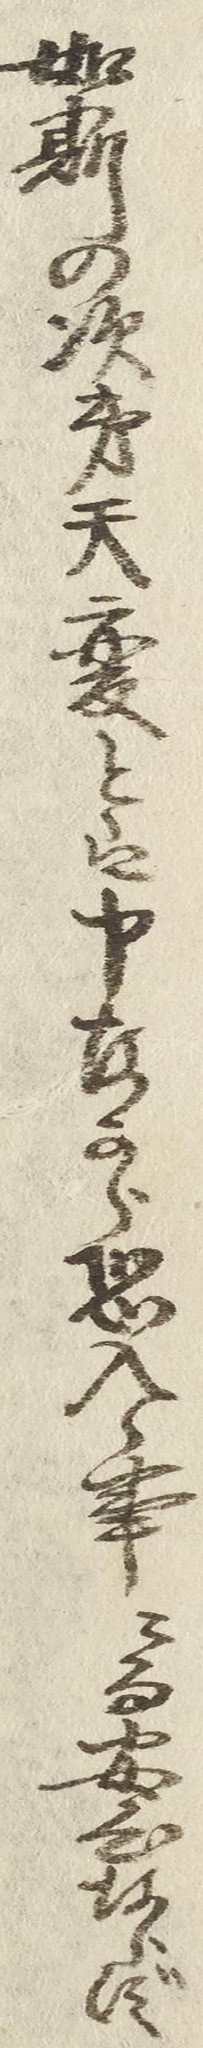如斯の次第天変とは申なから恐入侯事二而安心ならず
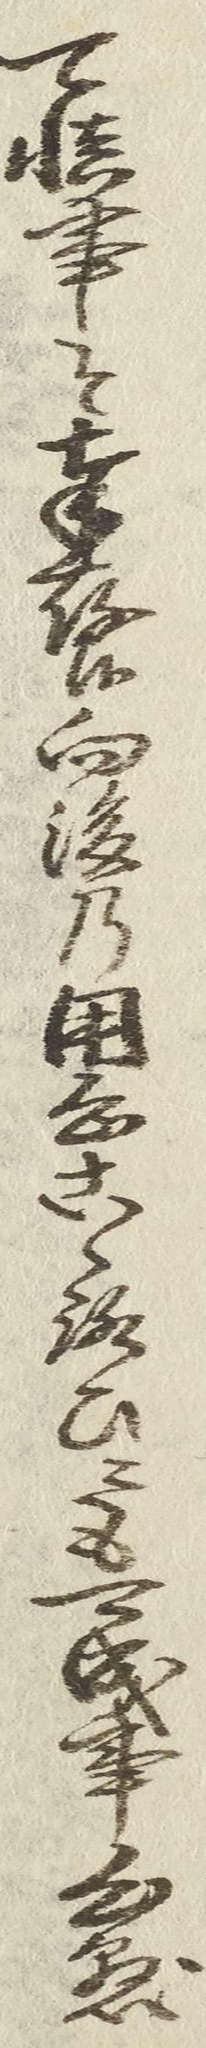て慎事と奉存候向後の用心こゝろひにも可成事心懸
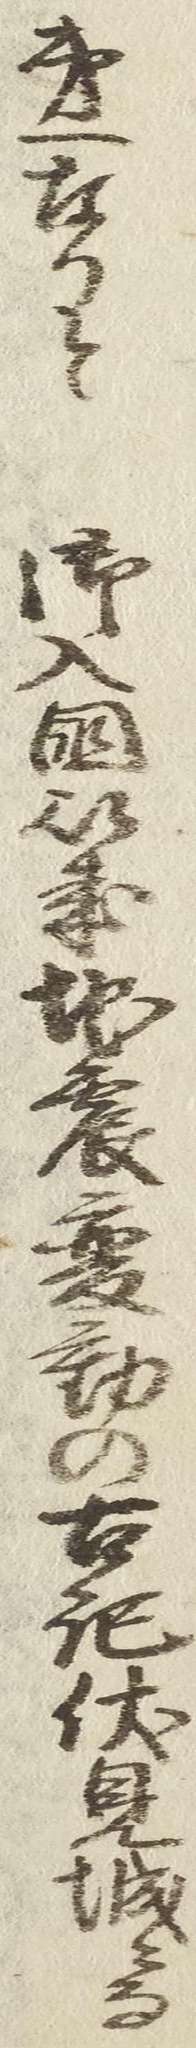第一なりと御入国以来地震変動の古記伏見城二而
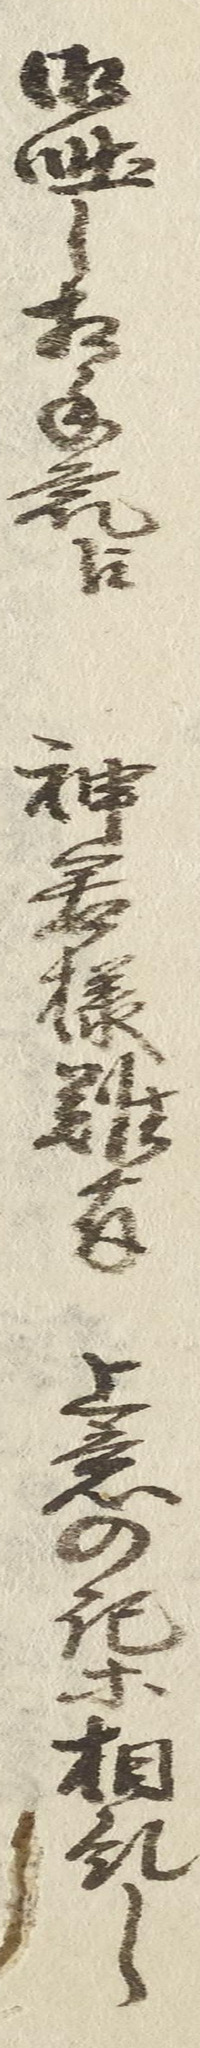御咄し相手衆江神君様難有上意の記等相糺し
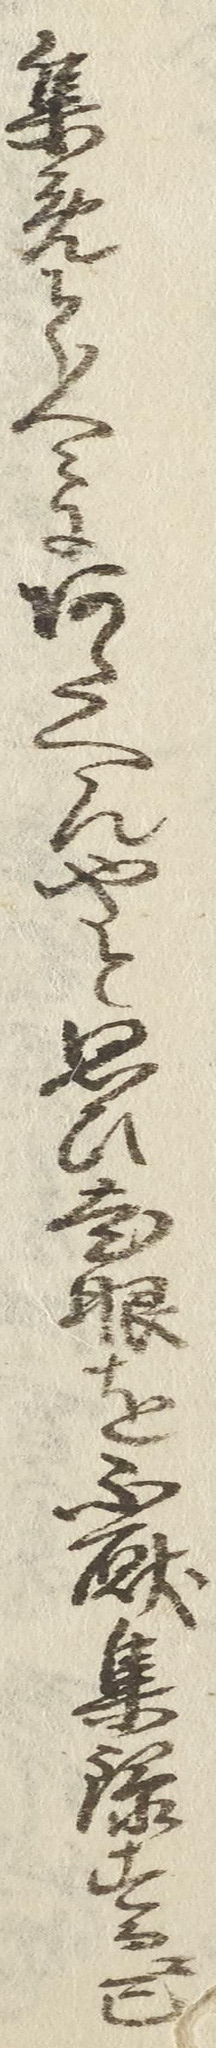集めて人々にあたへんやと思ひ老眼を不厭集録する而巳
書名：従往古地震御届書記誌之一
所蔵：東京大学地震研究所図書室 Earthquake Research Institute Library, The University of Tokyo, JAPAN
